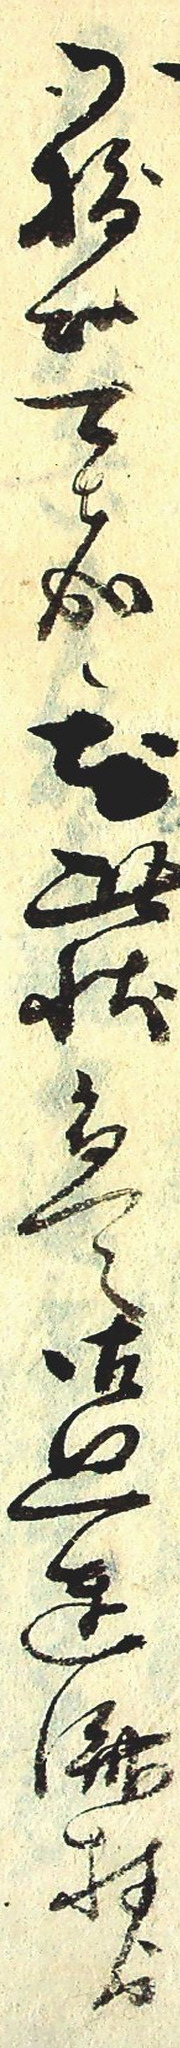御指出可被成候尤此状急々御廻達済村ゟ
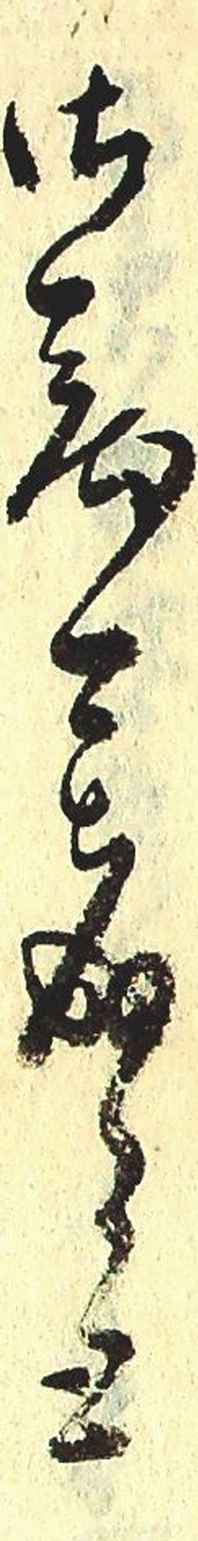御戻可被成候以上
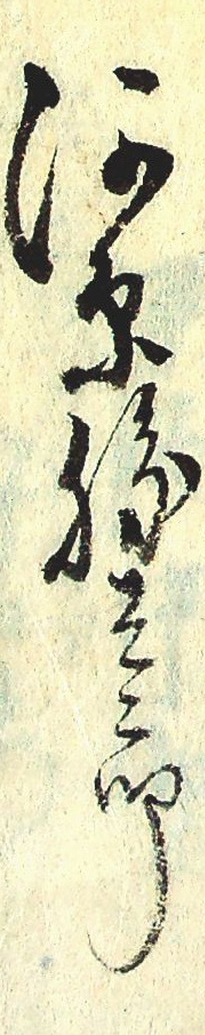河原勝太郎
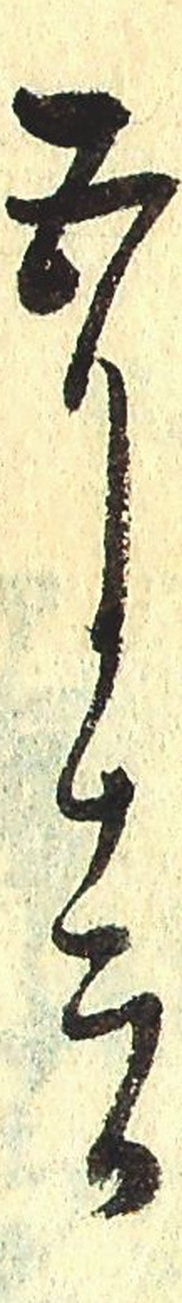五月十二日

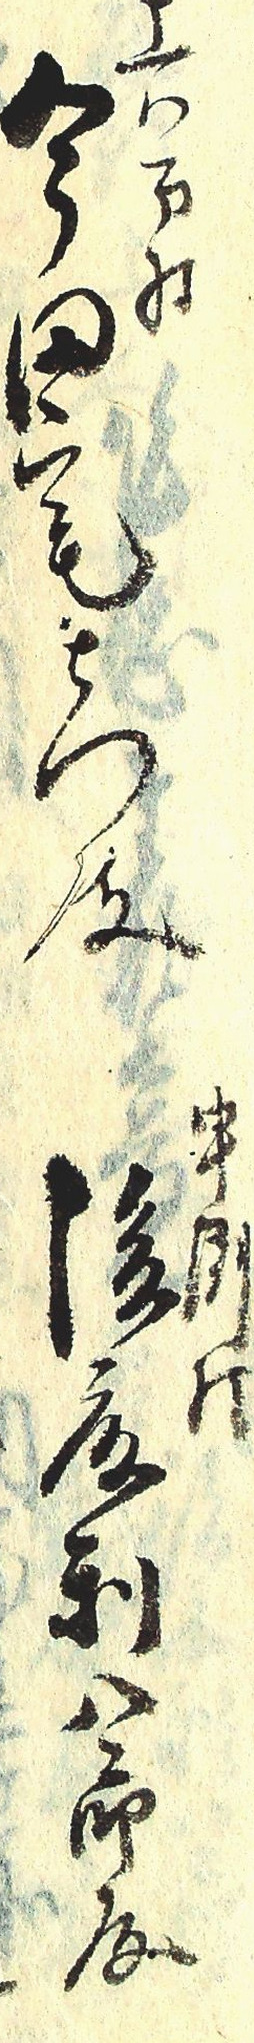今田宅右衛門殿後藤利八郎殿
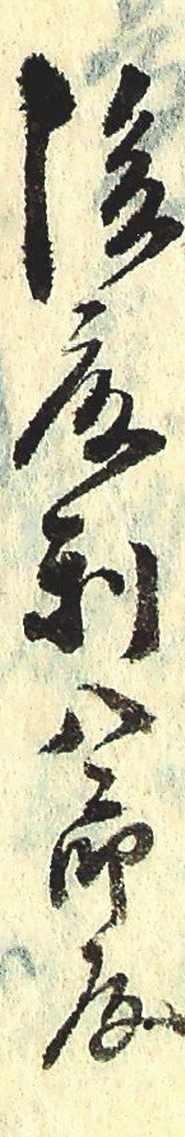後藤利八郎
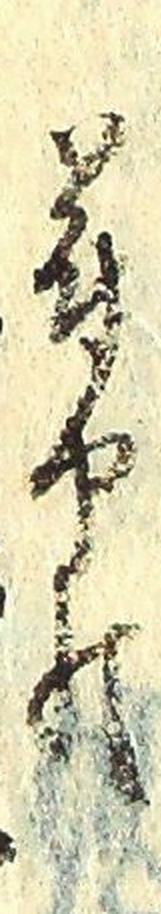同府中村
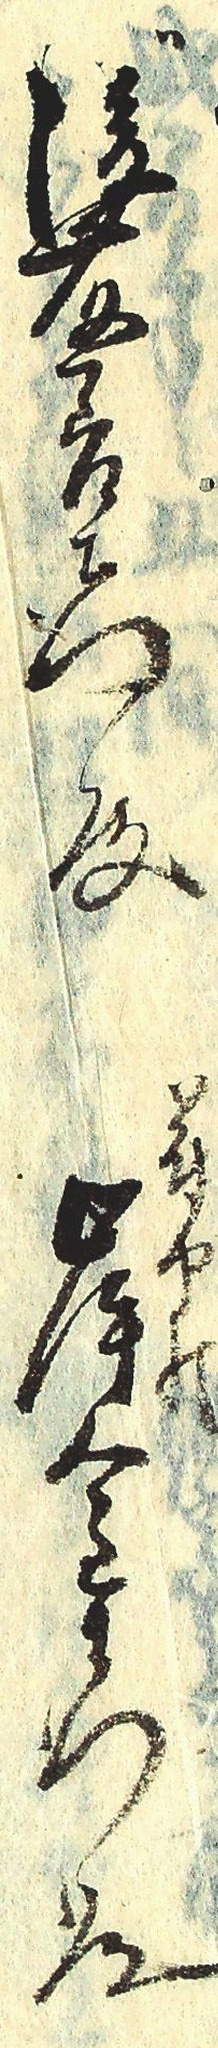後藤善右衛門殿岸金右衛門殿
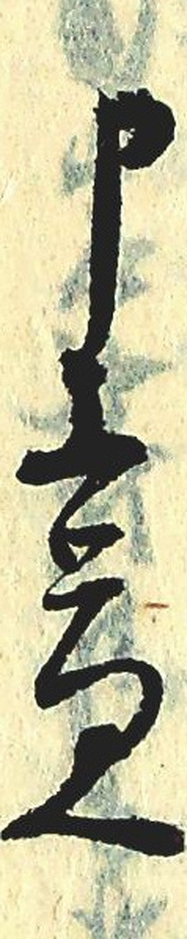申上覚
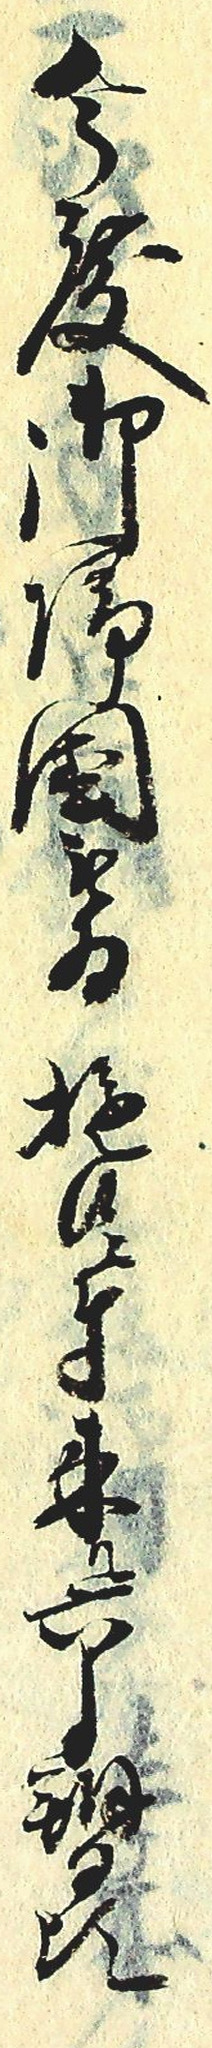今度御帰国被為遊候に付来る六月朔日比
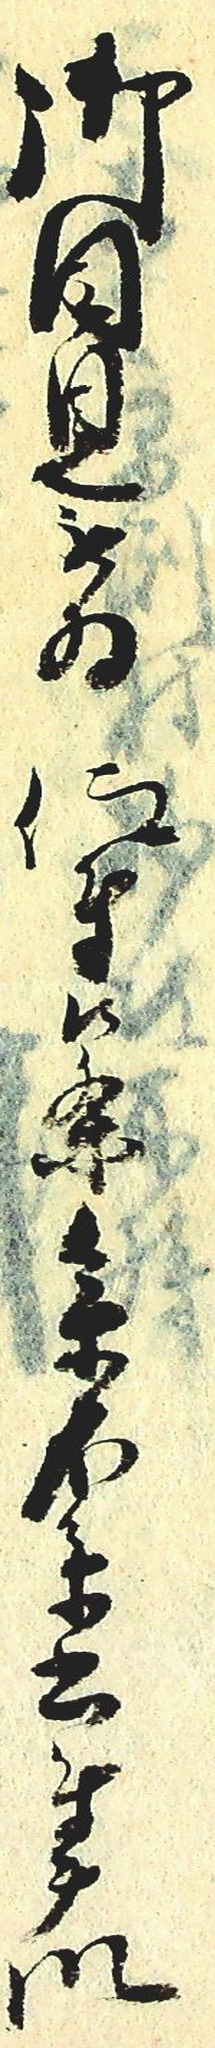御目見被為仰付候条参不参書付を以
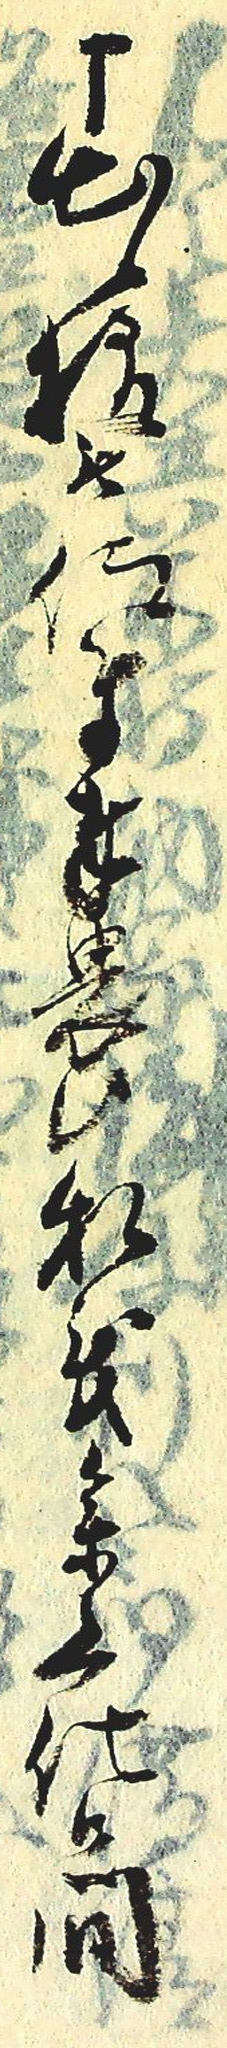申出候様被仰付奉畏候私義参上仕候間
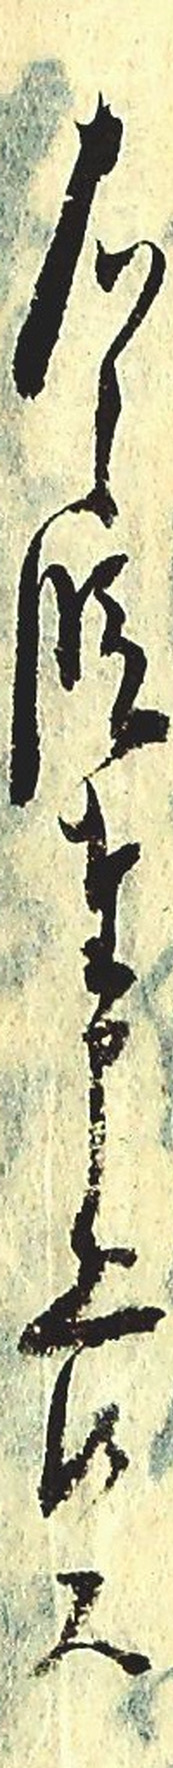右之段奉申上候以上
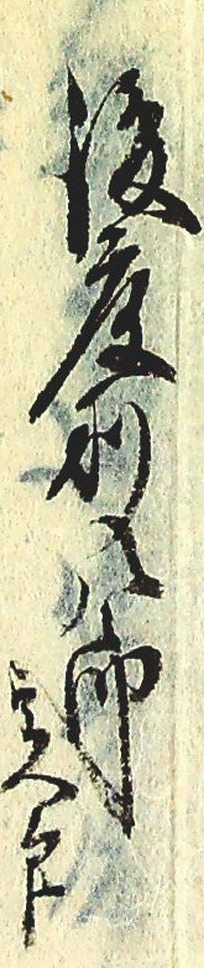後藤利八郎
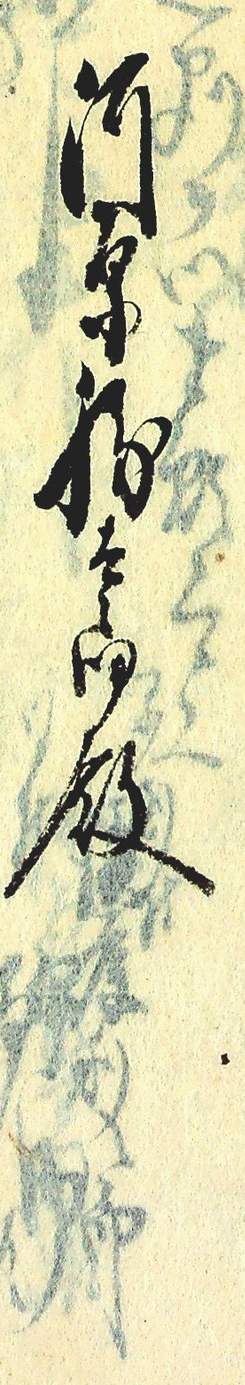河原勝太郎殿
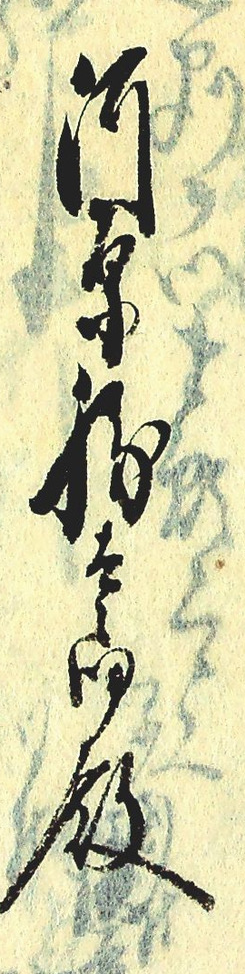河原勝太郎殿
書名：諸御願書控(弐番）
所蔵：鳴門教育大学 Naruto University of Education
